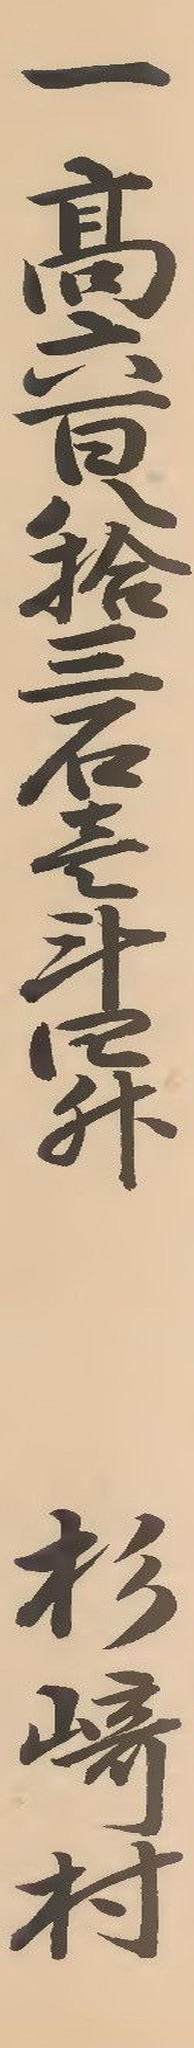一高六百八拾三石壱斗四升杉崎村
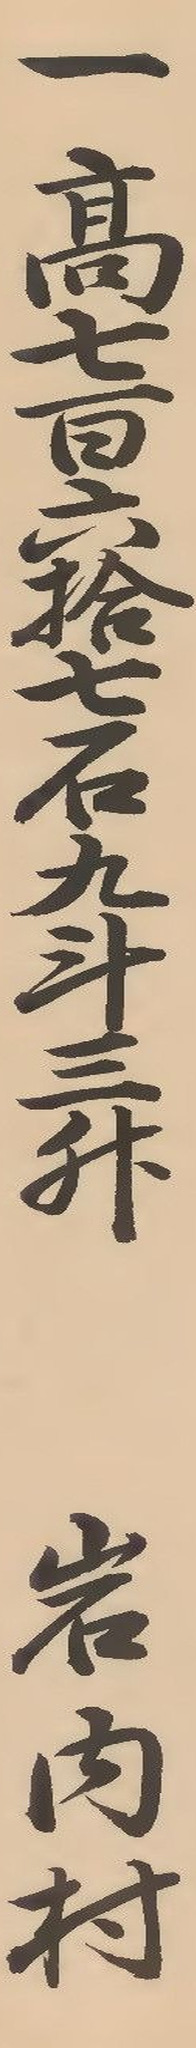一高七百六拾七石九斗三升岩内村
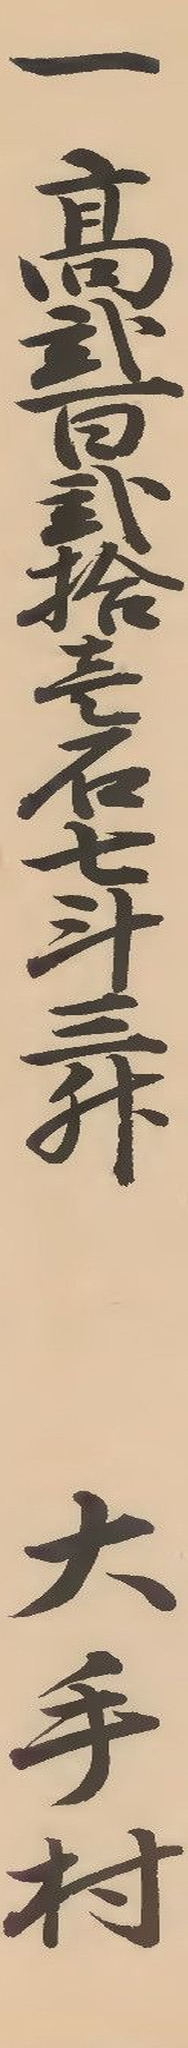一高弐百弐拾壱石七斗三升大手村
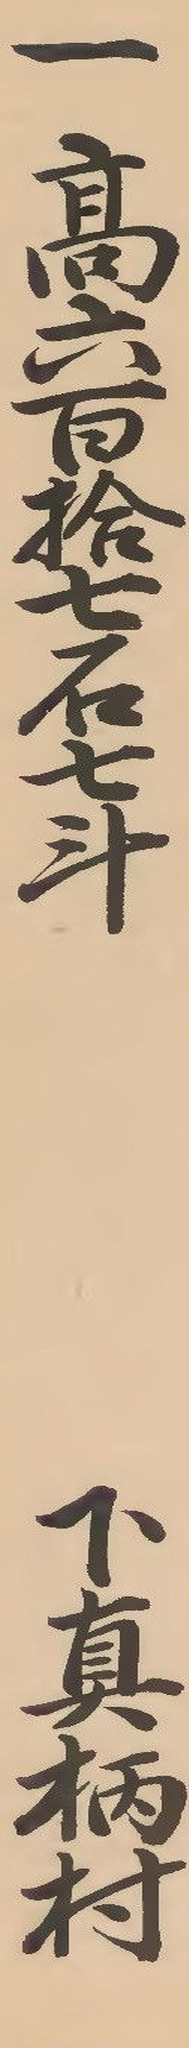一高六百拾七石七斗下真柄村

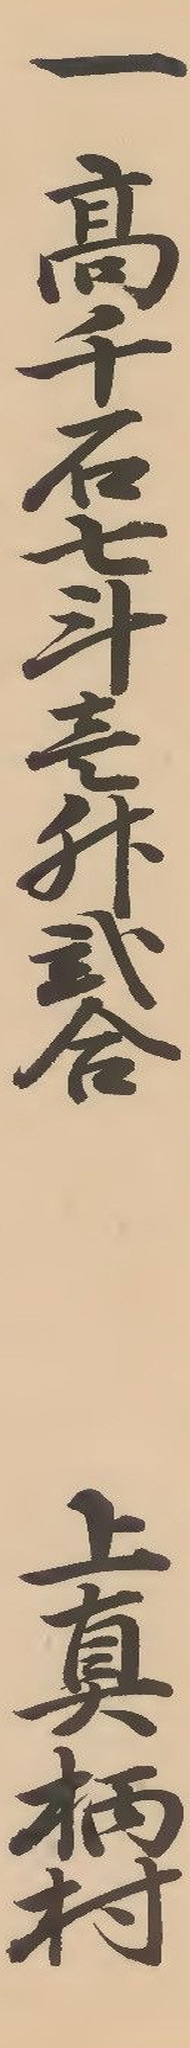一高千石七斗壱升弐合上真柄村
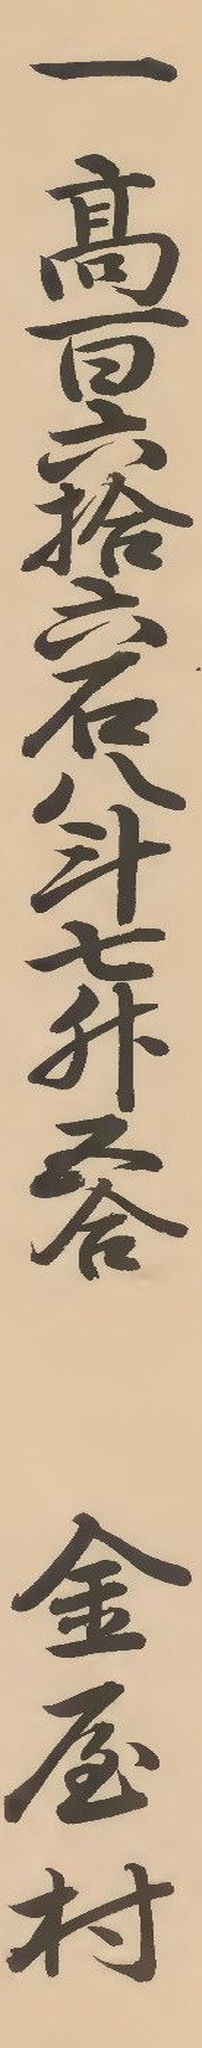一高百六拾六石八斗七升五合金屋村
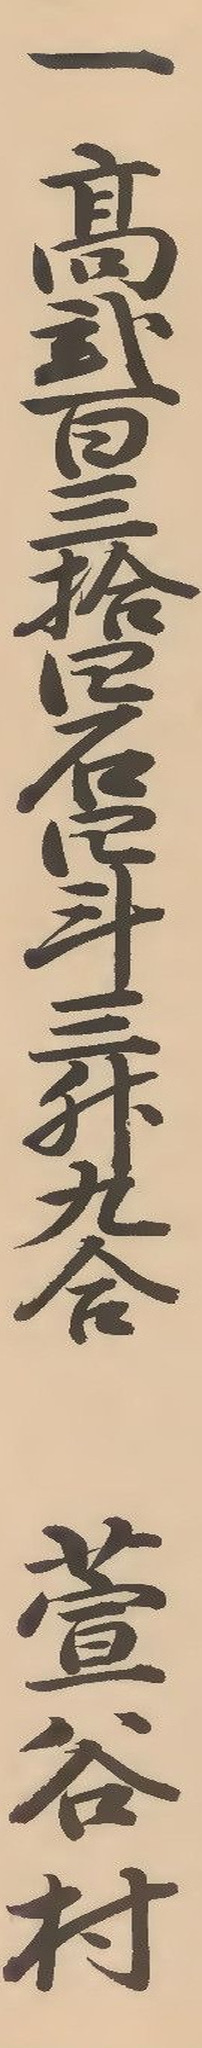一高弐百三拾四石四斗三升九合萱谷村
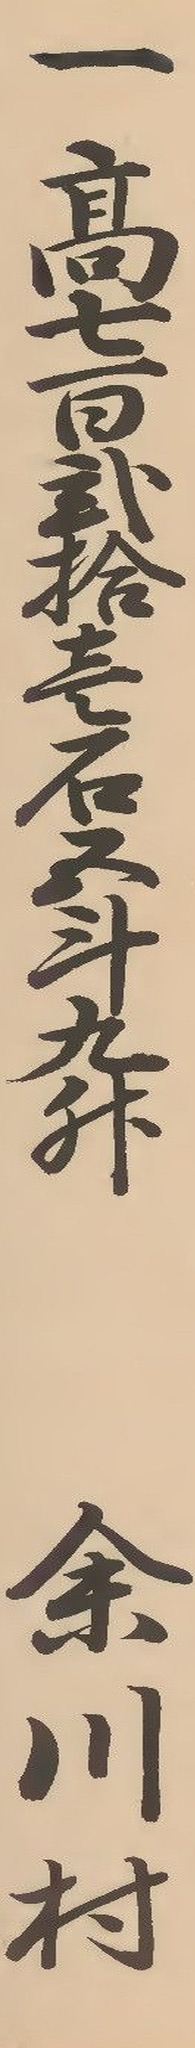一高七百弐拾壱石五斗九升余川村
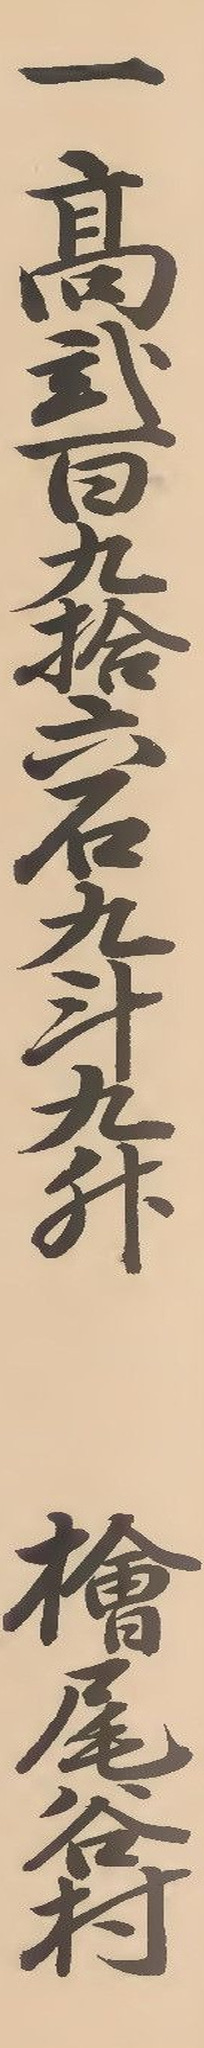一高弐百九拾六石九斗九升桧尾谷村

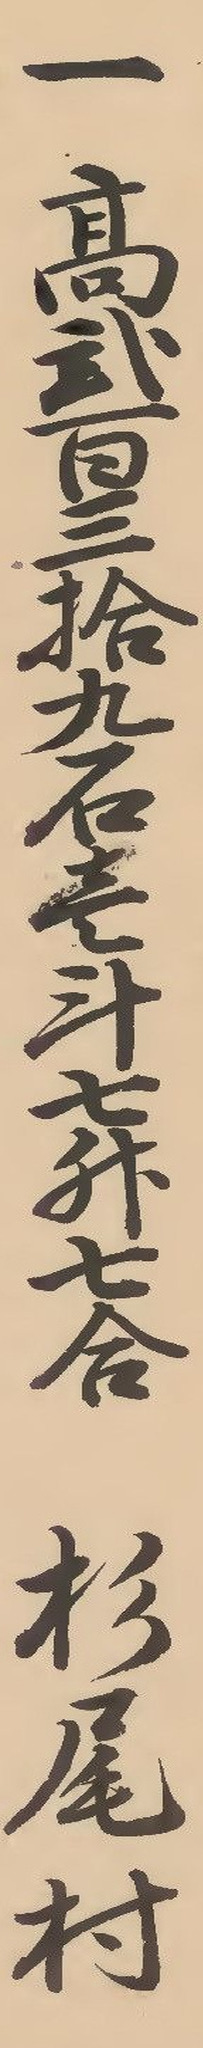一高弐百三拾九石壱斗七升七合杉尾村
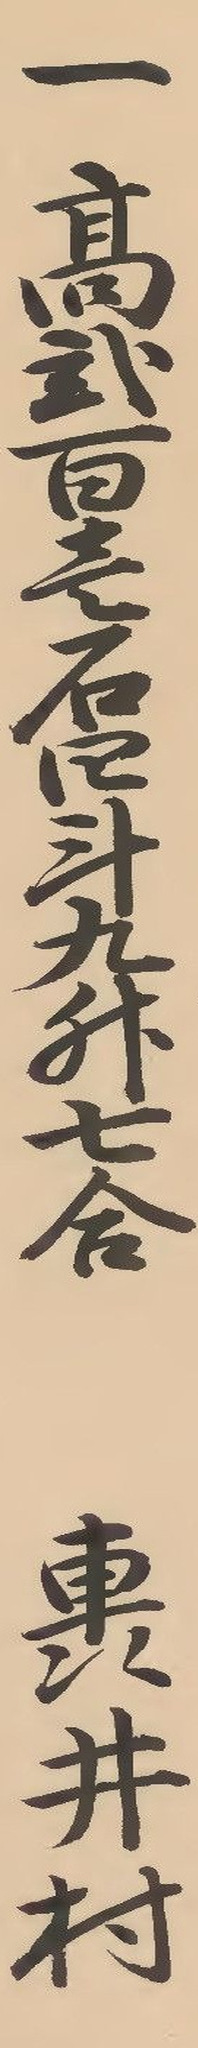一高弐百壱石四斗九升七合轟井村
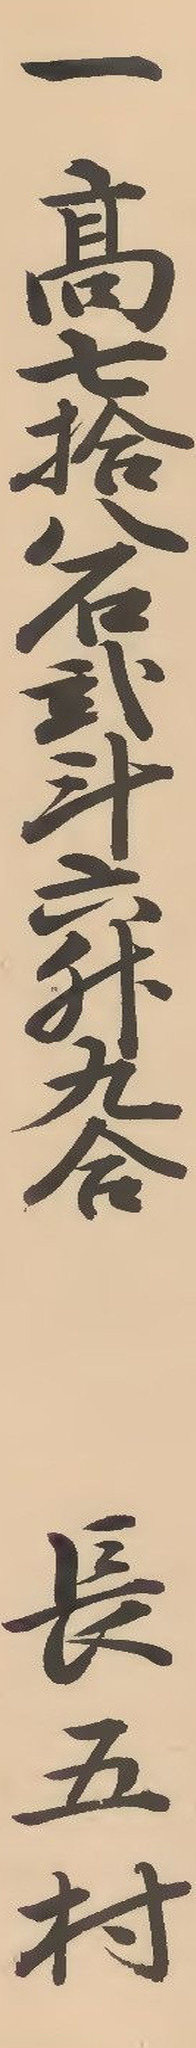一高七拾八石弐斗六升九合長五村
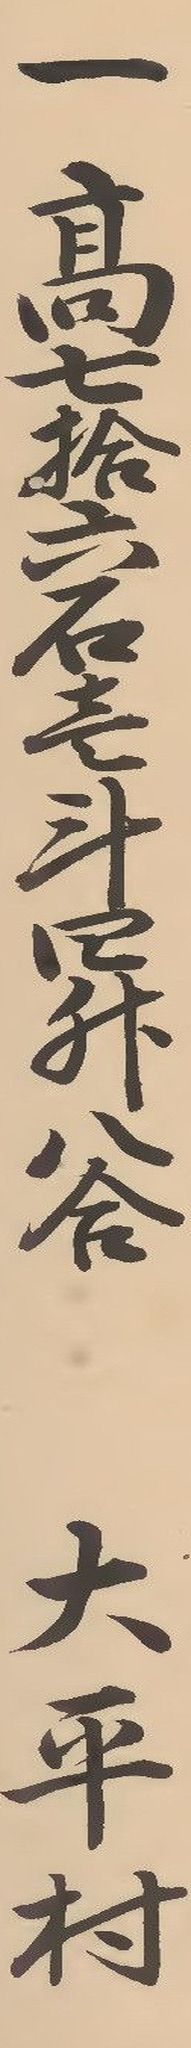一高七拾六石壱斗四升八合大平村
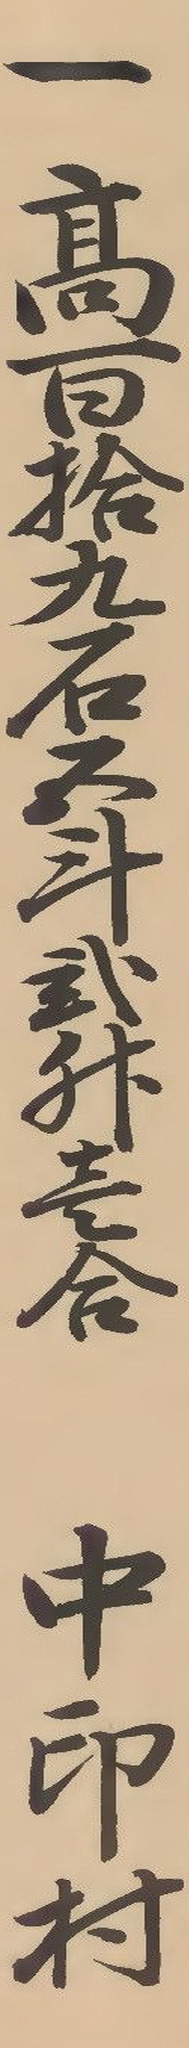一高百拾九石五斗弐升壱合中印村
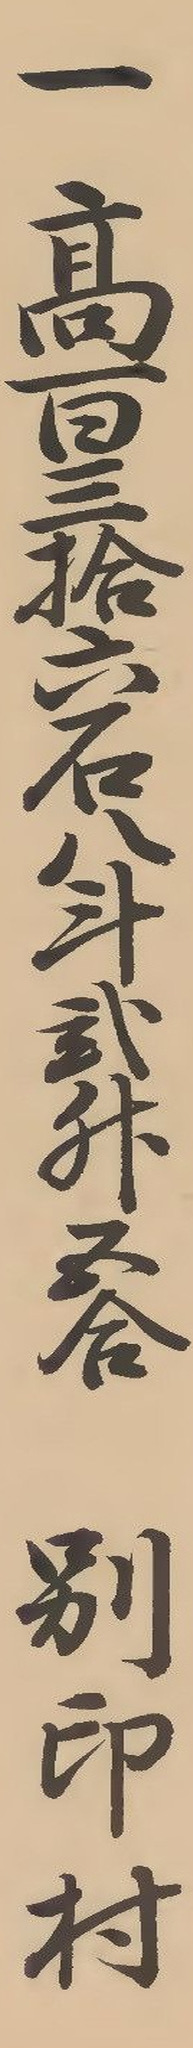一高百三拾六石八斗弐升五合別印村

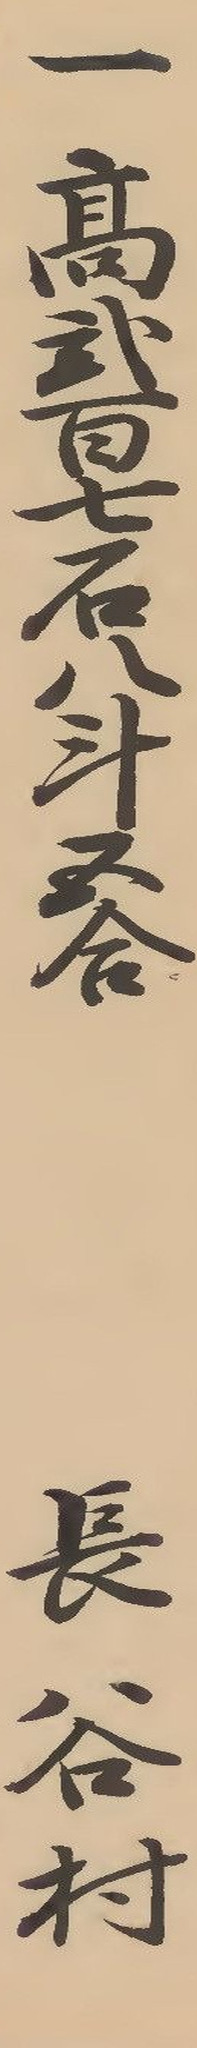一高弐百七石八斗五合長谷村
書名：越前国郷帳
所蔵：国立公文書館 National Archives of Japan
